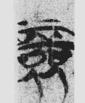競
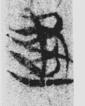建
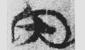内
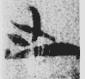之
